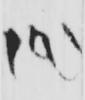州
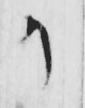人
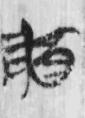𨟻（將）
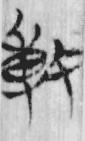○（捕）
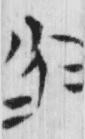小人
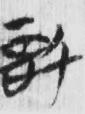○（信）
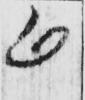㠯（以）
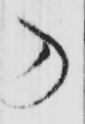刀
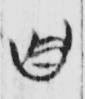自
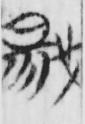傷
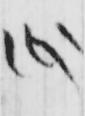州
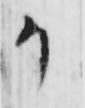人
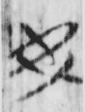𡚦（焉）
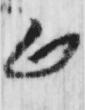㠯（以）
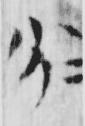小人
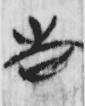告
